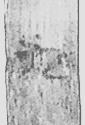九
